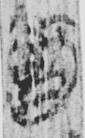智（知）
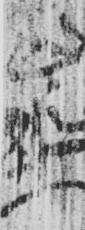○（萬）
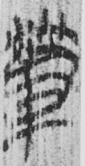𨍱（乘）
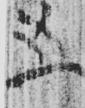之
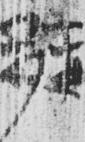邦
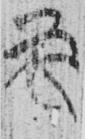而
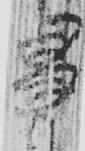貴
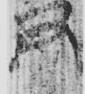尹
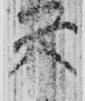亓（其）
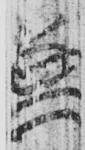爲
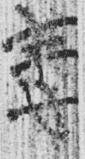○（災）
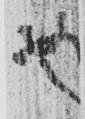也
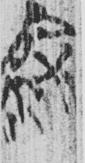深
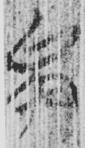矣
